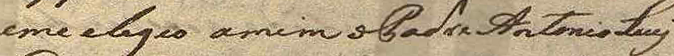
e me elegeo a mim o Padre Antonio Luis
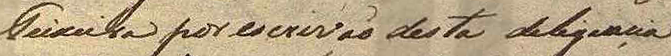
Teixeira por escrivaõ desta deligençia
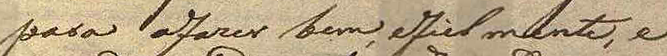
para a fazer bem, e fielmente, e
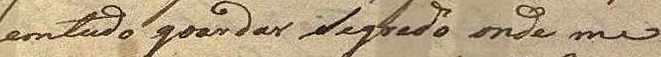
em tudo goardar segredo onde me
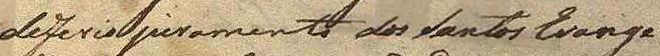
deferio juramento dos Santos Evange
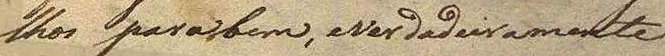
lhos para bem, e verdadeiramente
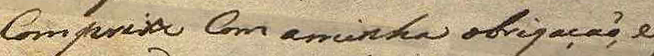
Comprir Com a minha obrigaçaõ, e
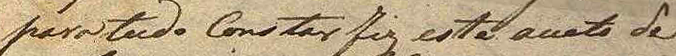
para tudo Constar fiz este aucto de
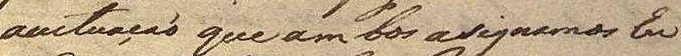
auctuaçaõ que ambos asignamos Eu
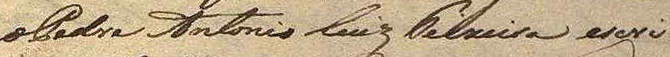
o Padre Antonio luiz Teixeira escri
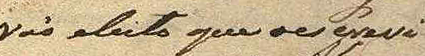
vaõ eleito que o escrevi
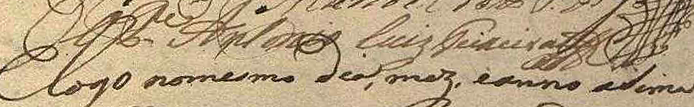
E logo no mesmo dia, mez, e anno aSima
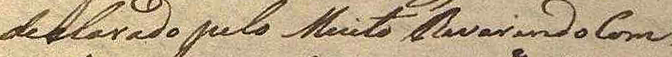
declarado pelo Muito Reverendo Com
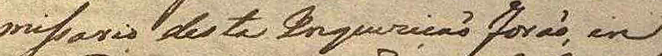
missario desta Inquiziçaõ foraõ, in
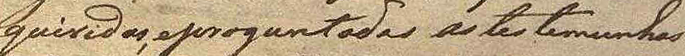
quiridas, e proguntadas as testemunhas
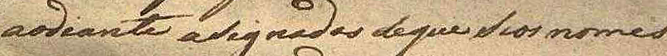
ao diante asignadas de que Seos nomes
